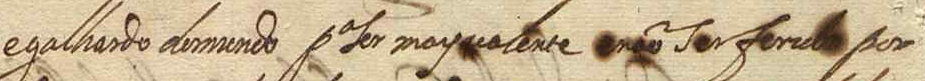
e galhardo do mundo pa ser mais ualente e naõ ser ferido por
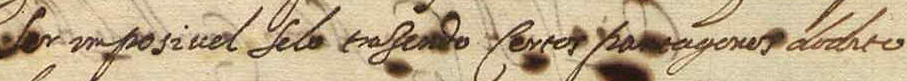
ser imposiuel selo trazendo Certos pantagonos do dito
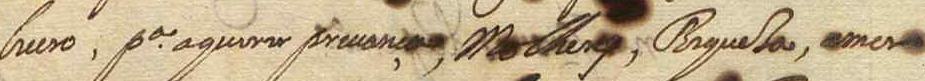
liuro, p.a aquirir priuança, Molheres, Riqueza, amor
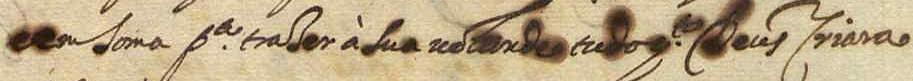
e em soma p.a trazer à sua uōtarde tudo q.to Deus Criara
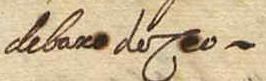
debaxo do Ceo.
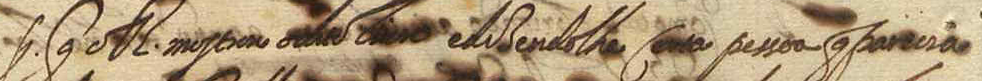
ꝓ. q̄ o R. mostrou o dito liuro e dizendolhe Certa pessoa q̄ parecia
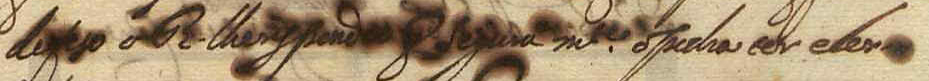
defeso o R. lhe respondeo q̄ seguram.te o podia ter e ler.
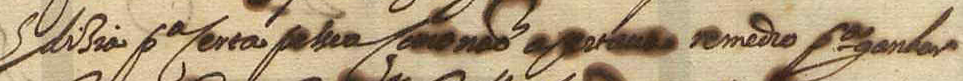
E disia pa Certa pessoa Como naõ aseitaua remedio p.a ganhar
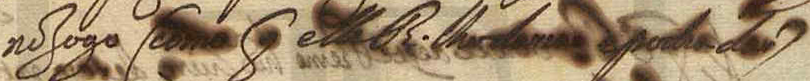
no Jogo (como q̄ elle R. lho daria e podia dar)
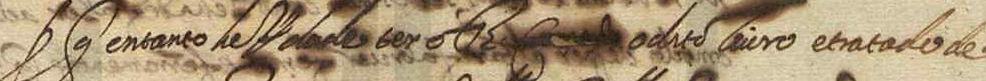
Ꝓ q̄ entanto he Ꝟdade ter o R. Ce_ado o dito liuro e tratado de
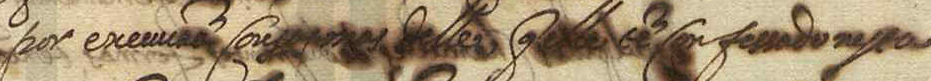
por execuçaõ Cousas mas delle q̄ elle tē Confessado nesta
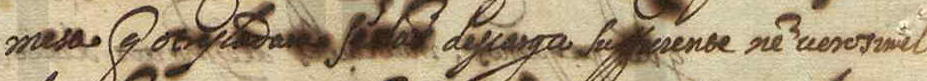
mesa q̄ o tresladara sē dar descarga sufficiente nē uerosimel
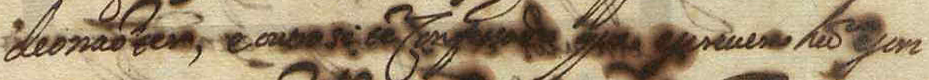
de o naõ ter, e outrosi tē Confessado que escreuera hū escri
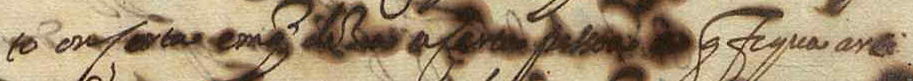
to ou Carta em q̄ dizia a Certa pessoa o q̄ fiqua arti
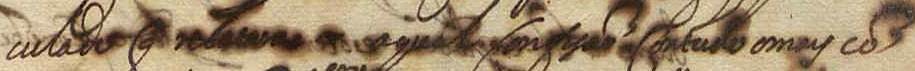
culado q̄ relatara. a qual Confisaõ Con tudo o mais cō
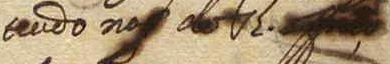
teudo no q̄ do R. offreço
